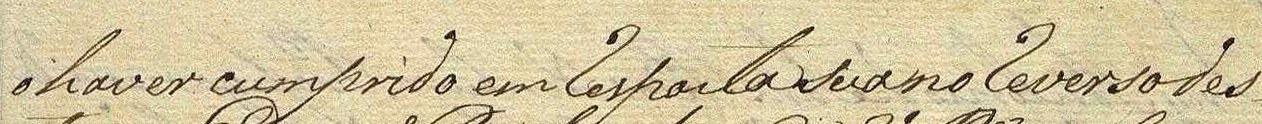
o haver cumprido em Resposta sua no Reverso des
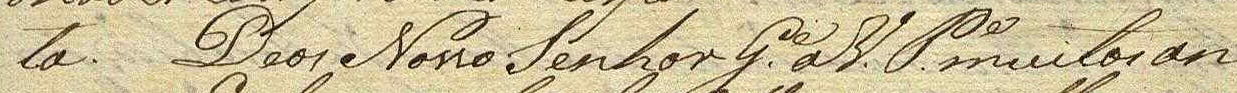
ta. Deos Nosso Senhor G.e a V. P.e muitos an
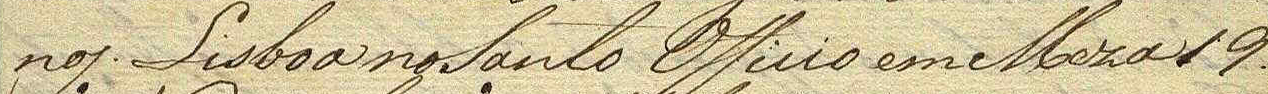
nos. Lisboa no Santo Officio em Meza 19
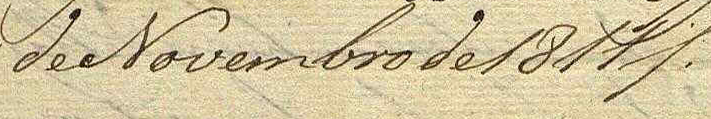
de Novembro de 1811/.
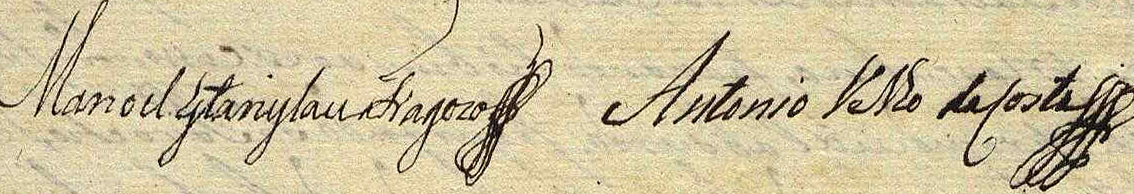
Manoel Estanislau Fragozo Antonio Velho da Costa
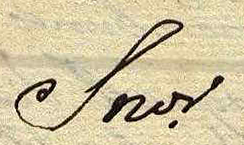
Sn.or
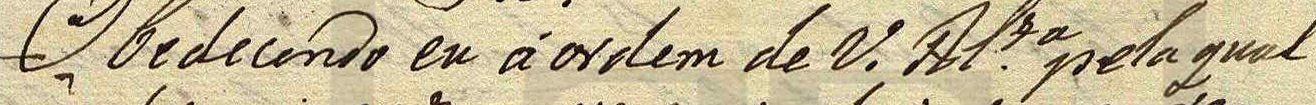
Obedecendo eu á ordem de V. Al.ta pela qual
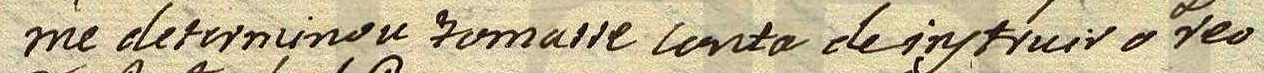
me determinou tomasse conta de instruir o reo
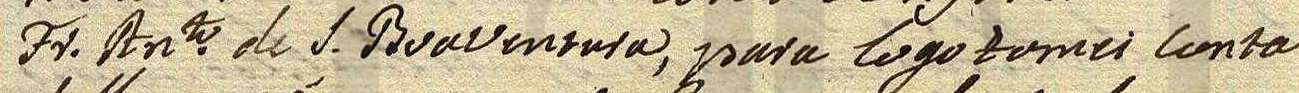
Fr. An.to de S. Boaventura, para logo tomei conta
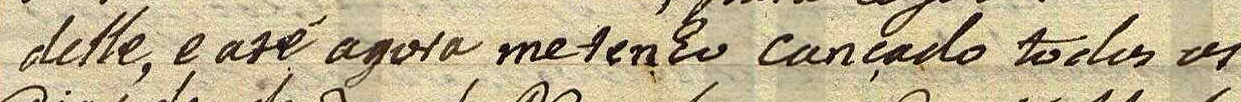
delle, e até agora me tenho cançado todos os
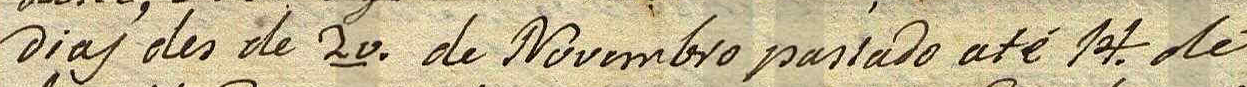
dias desde 20. de Novembro passado até 14. de
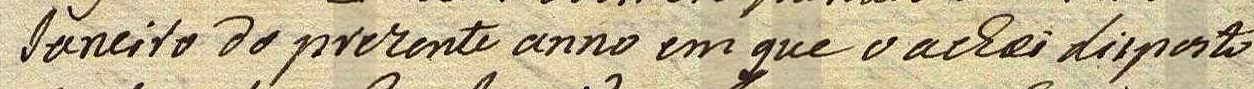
Ianeiro do prezente anno em que o achei disposto
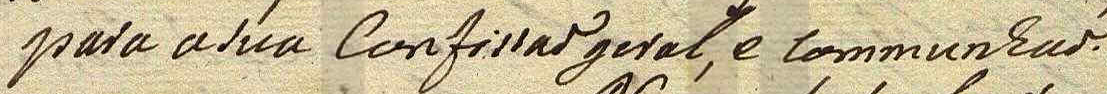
para a sua Confissaõ geral, e communhaõ.
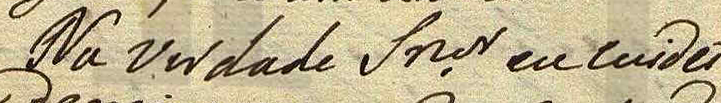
Na verdade Sn.or eu cuidei
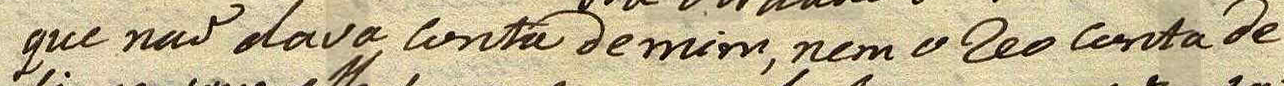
que naõ dava conta de mim, nem o Reo conta de
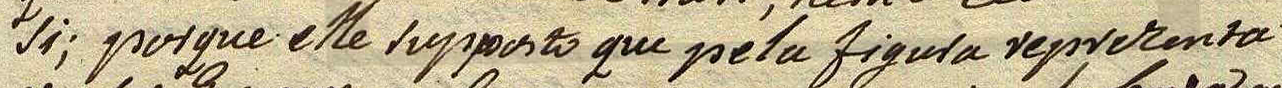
si; porque elle supposto que pela figura reprezenta
